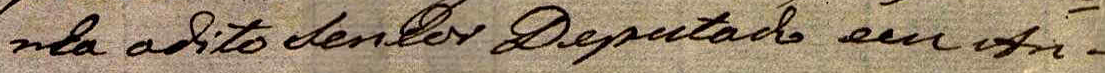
nha o dito Senhor Deputado e eu An
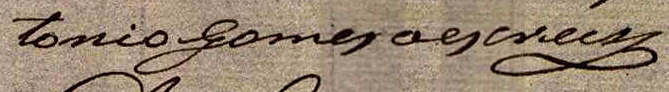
tonio Gomes o escreuy
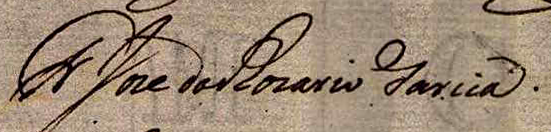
Fr Joze do Rozario Garcia.
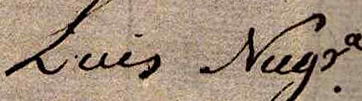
Luis Nugr.a
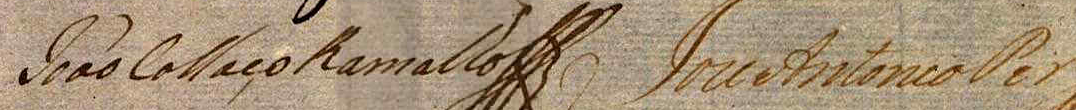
Ioaõ Collaço Ramalho Joze Antonio Per.a
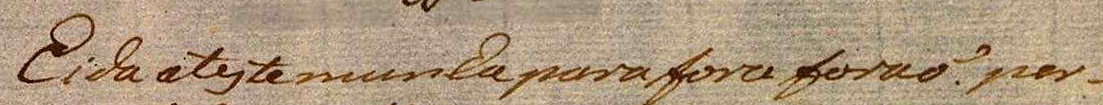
E ida a testemunha para fora foraõ per
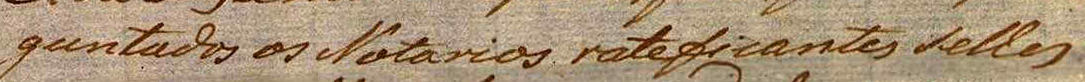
guntados os Notarios rateficantes se lhes
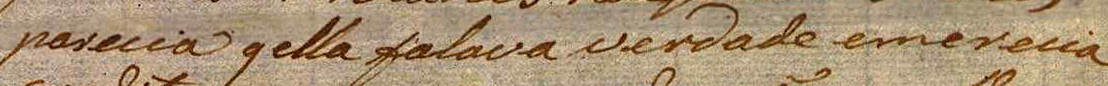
parecia q̄ ella falava verdade e merecia
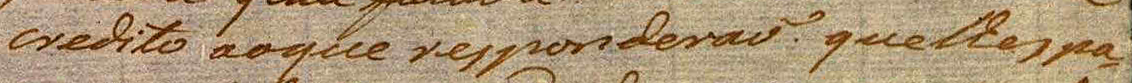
credito ao que responderaõ que lhes pa
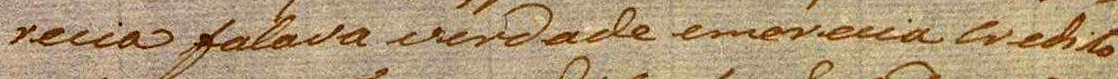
recia falava verdade e merecia credito
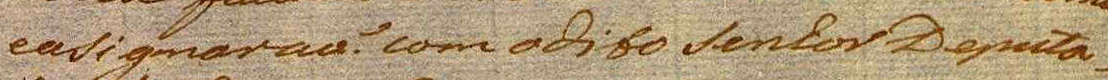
e asignaraõ com o dito senhor Deputa
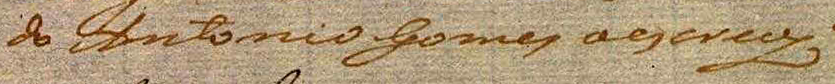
do Antonio Gomes o escreuj
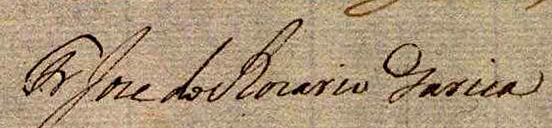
Fr Joze do Rozario Garcia
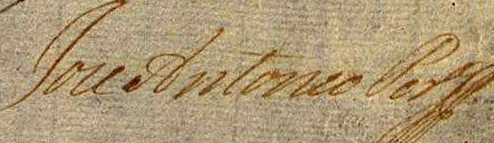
Joze Antonio Per.a
